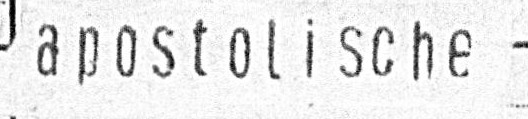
apostolische
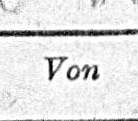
Von
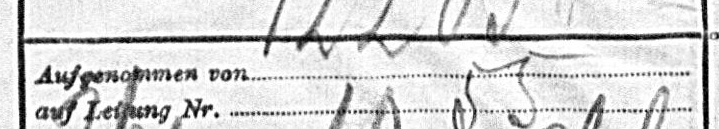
Aufgenommen von...
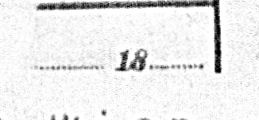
...18...
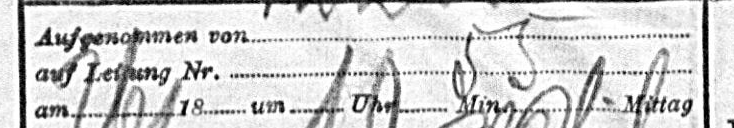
auf Leitung Nr.
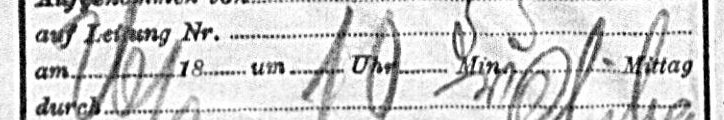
am... 18... um Uhr... Min... Mittag
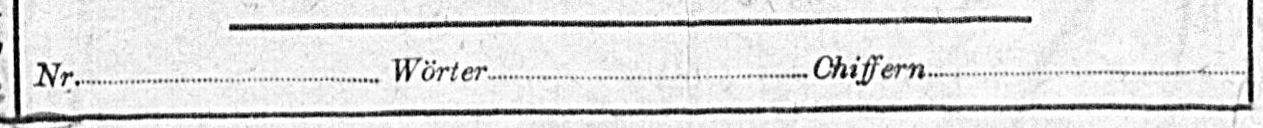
Nr...Wörter...Chiffern...
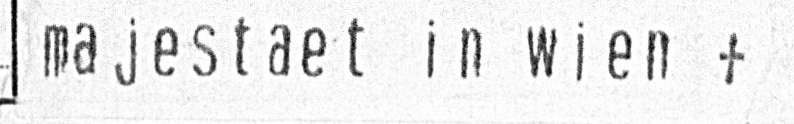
majestaet in wien +
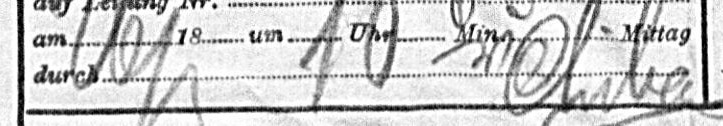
durch.....
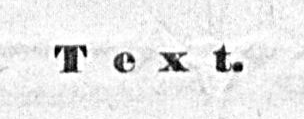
Text.
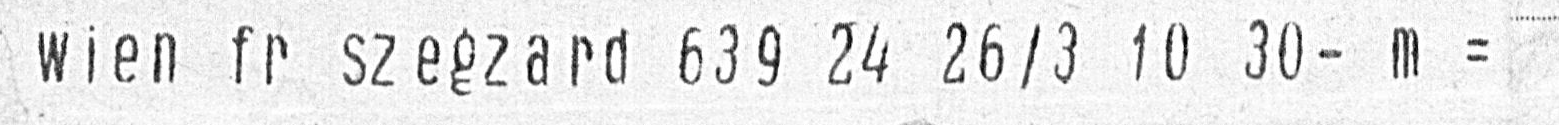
wien fr szegzard 639 24 26/3 10 30-m =
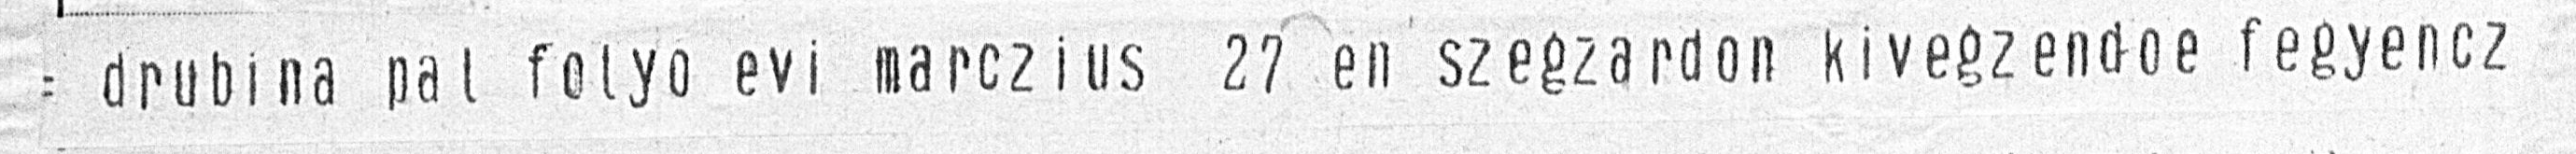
= drubina pal folyo evi marczius 27 en szegzardon kivegzendoe fegyencz
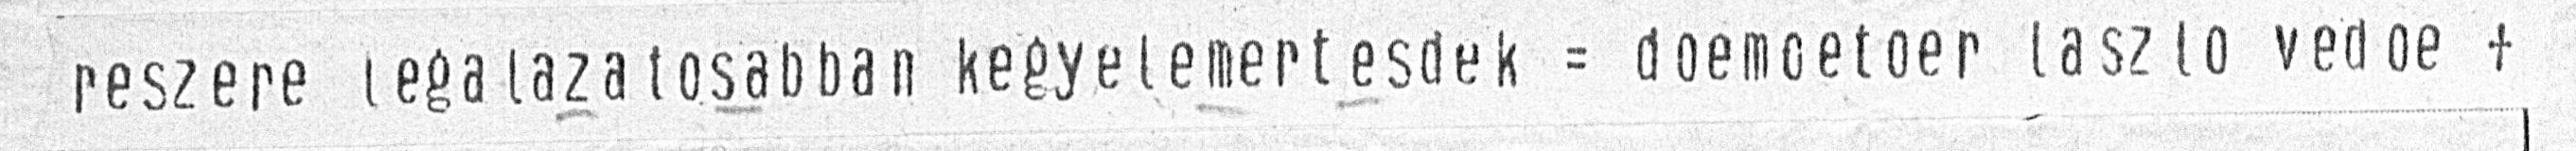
reszere legalazatosabban kegyelemertesdek = doemoetoer laszlo vedoe +
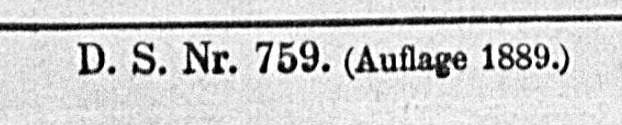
D. S. Nr. 759. (Auflage 1889.)
